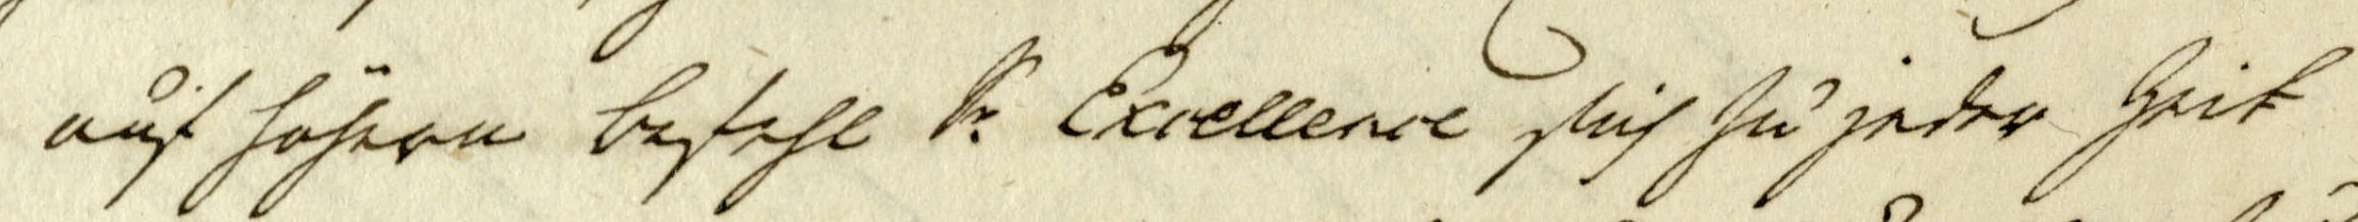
auf höhern Befehl Sr. Excellence sich zu jeder Zeit
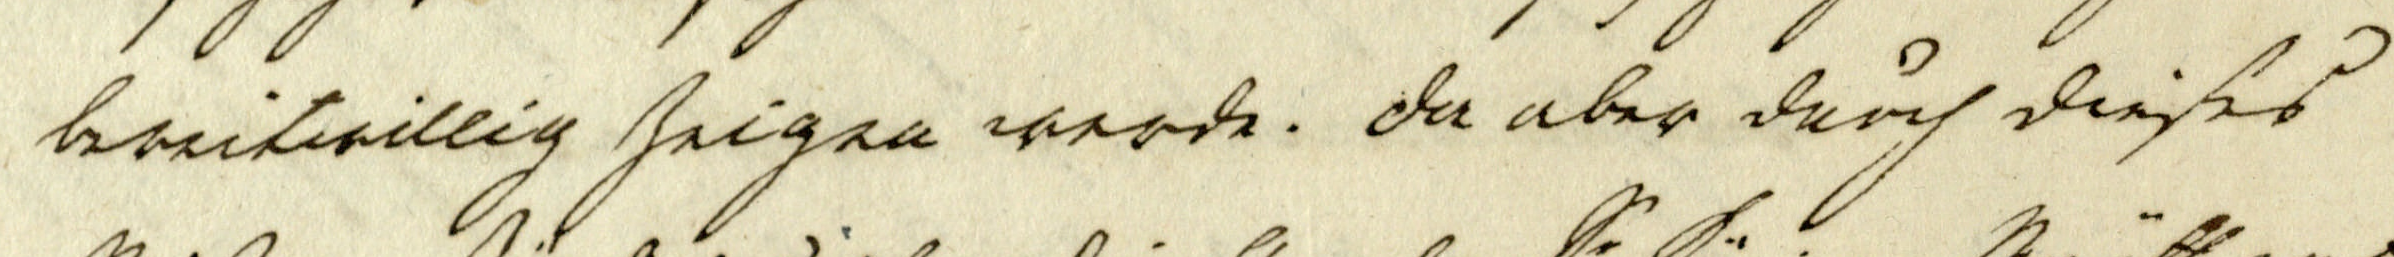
bereitwillig zeigen werde. da aber durch dieses
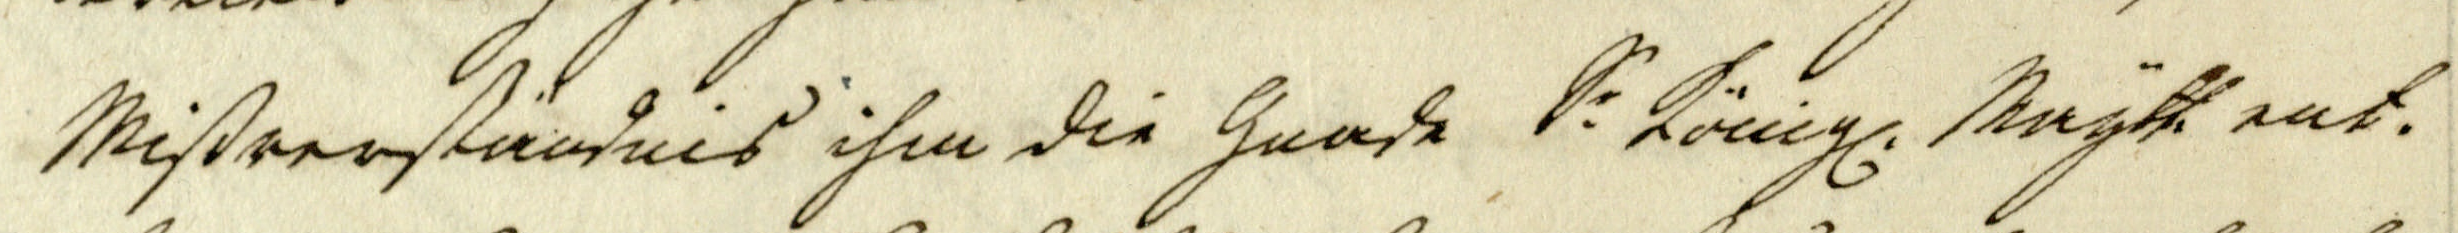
Mißverständnis ihm die Gnade Sr. Königl. Maÿtt. ent¬
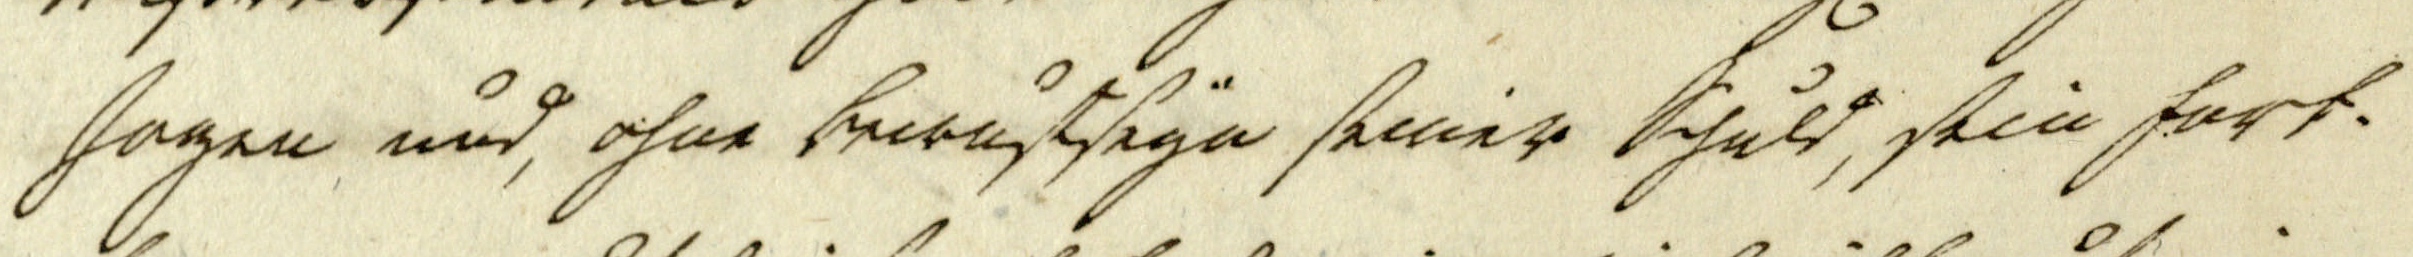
zogen und ohne Bewustseÿn seiner Schuld, sein Fort¬
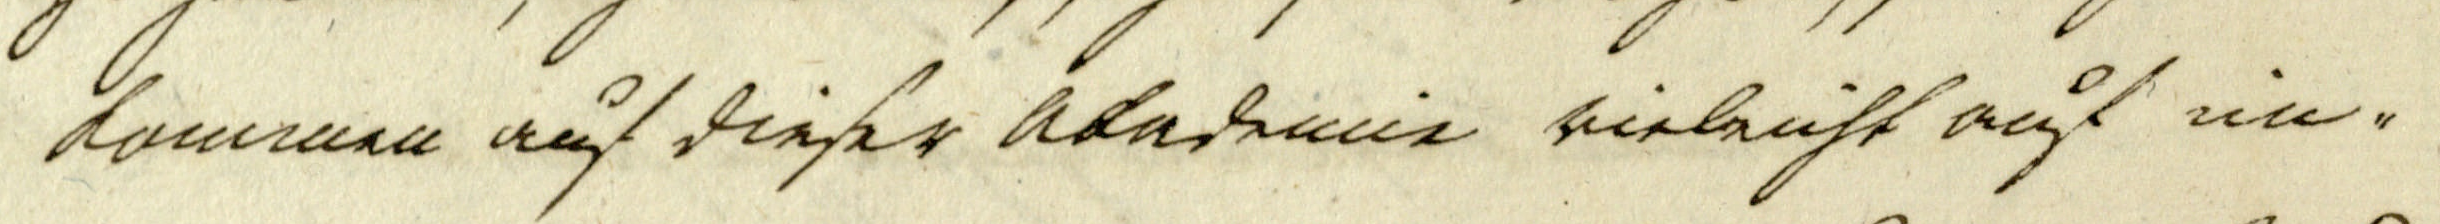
kommen auf dieser Akademie vieleicht auf im¬
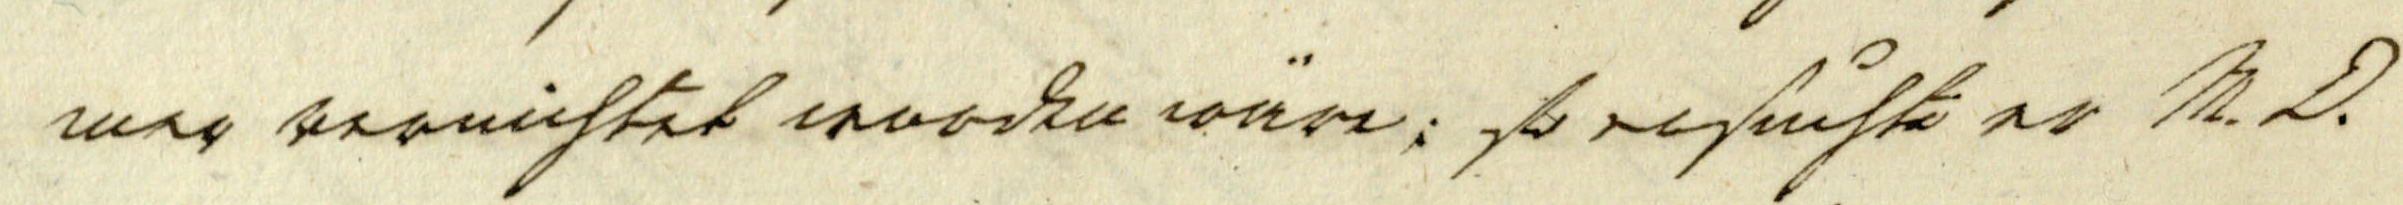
mer vernichtet worden wäre, so ersuchte er M. D.
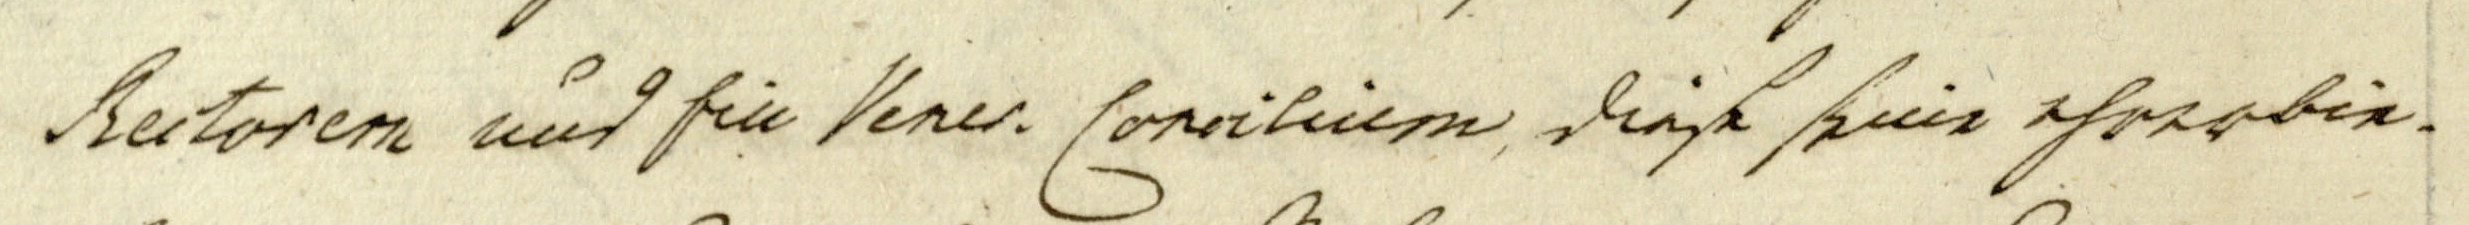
Rectorem und Ein Vener. Concilium, diese seine ehrerbie¬
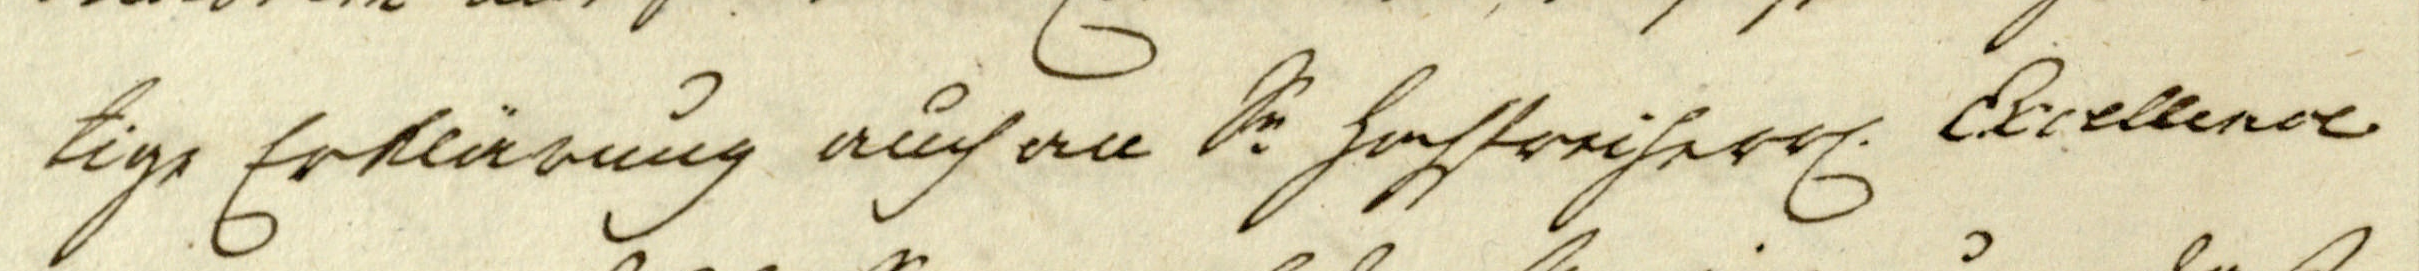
tige Erklärung auch an Sr. Hochfreiherrl. Excellence
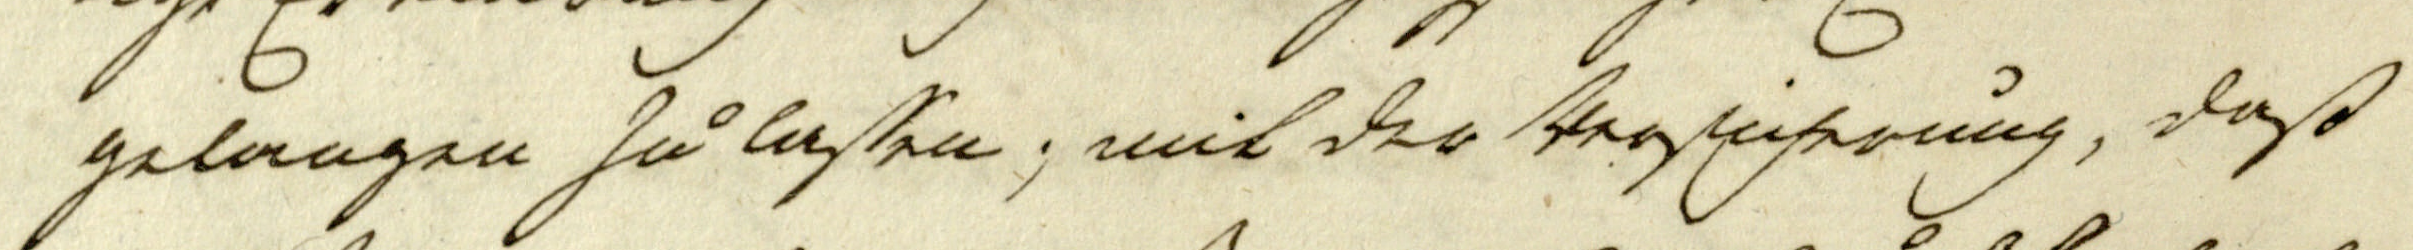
gelangen zu lassen, mit der Versicherung, daß
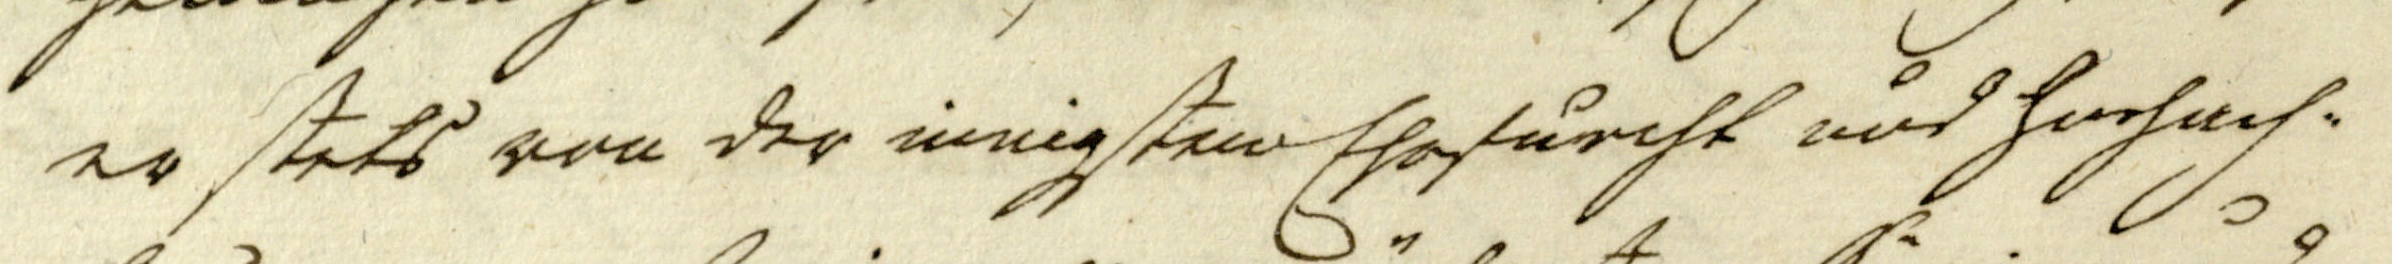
er stets von der innigsten Ehrfurcht und Hochach¬
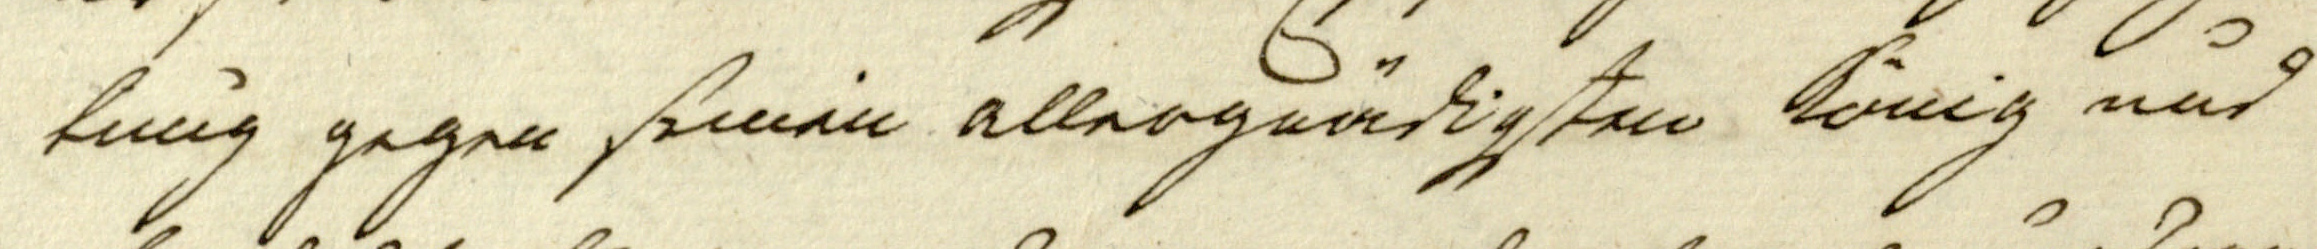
tung gegen seinen allergnädigsten König und
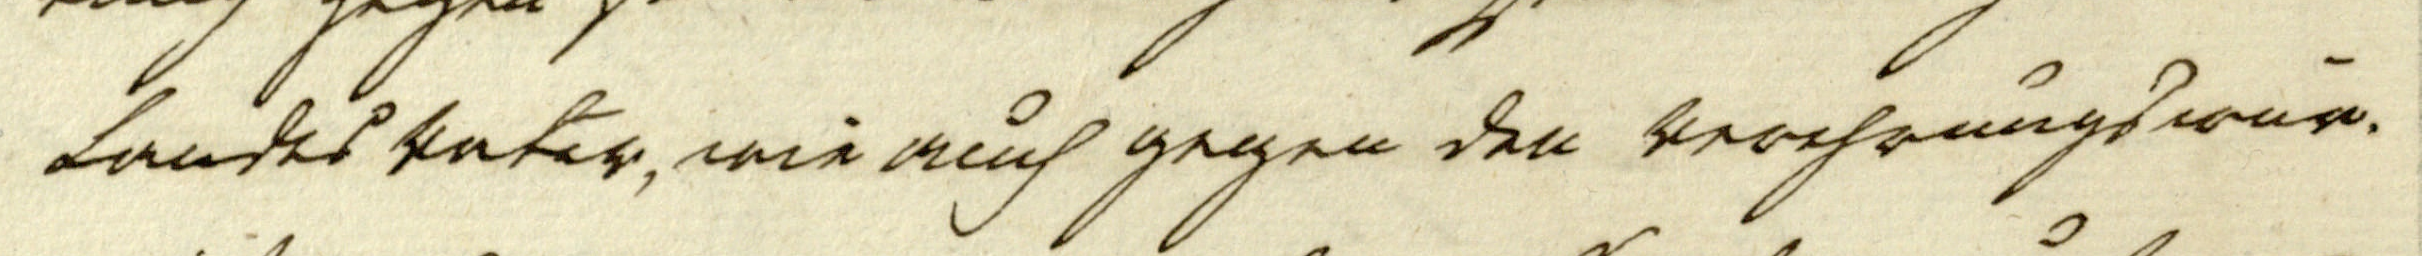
Landes Vater, wie auch gegen den verehrungswür¬
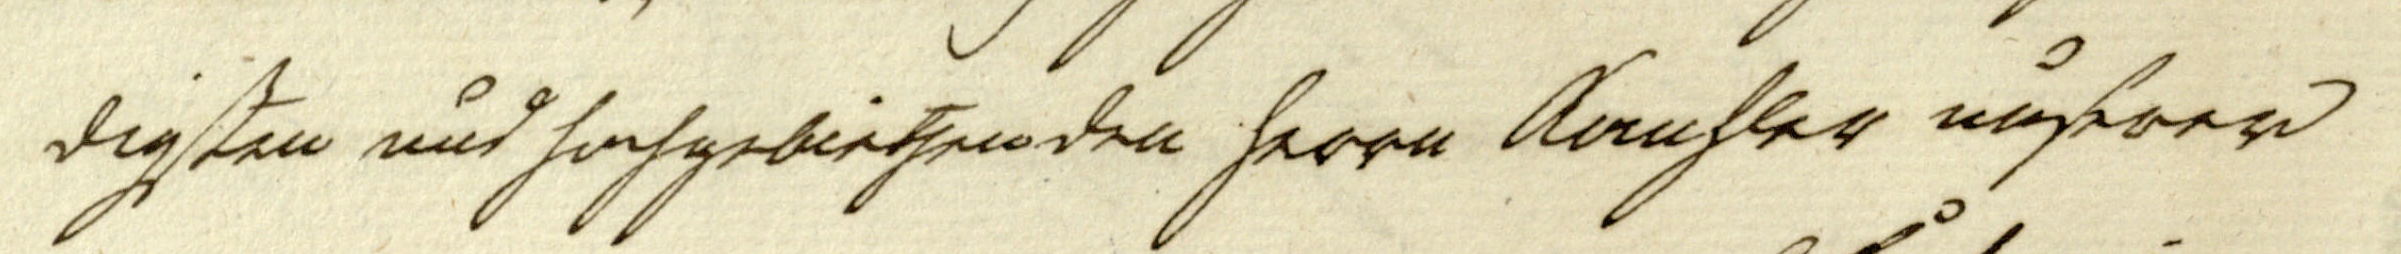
digsten und hochgebiethenden herrn Kanzler unserer
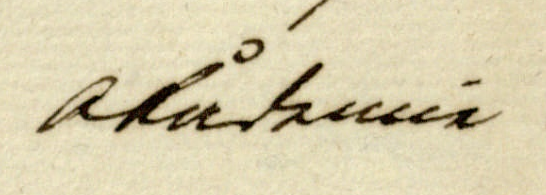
Akademie
